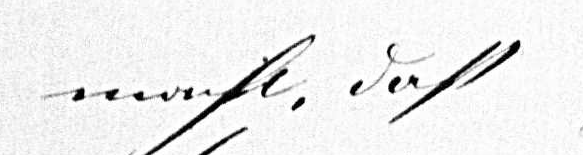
gemacht, daß
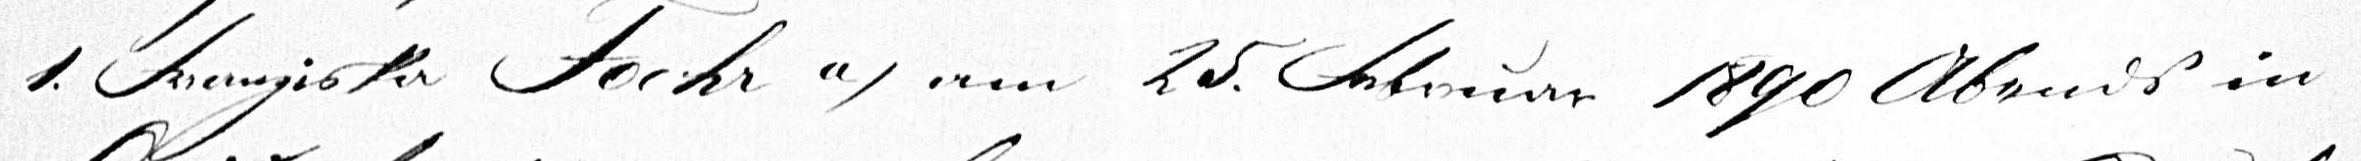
1. Franziska Foehr a) am 25. Februar 1890 Abends in
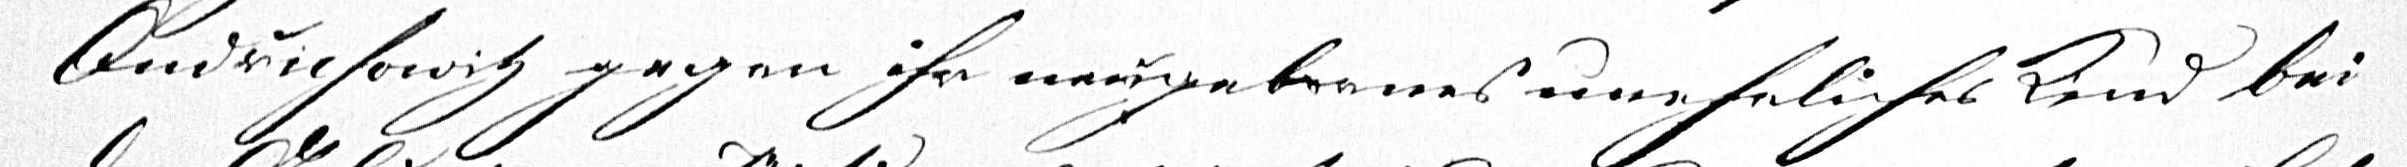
Andrichowitz gegen ihr neugeborenes uneheliches Kind bei
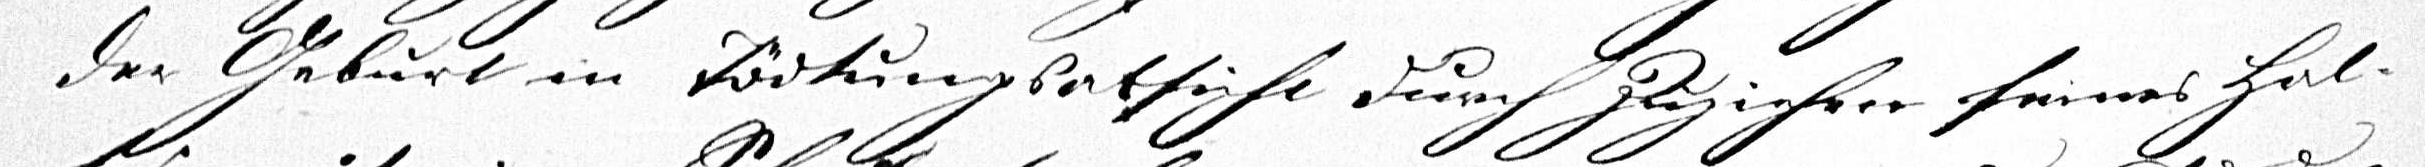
der Geburt in Tödtungsabsicht durch Zuziehen seines Hal¬
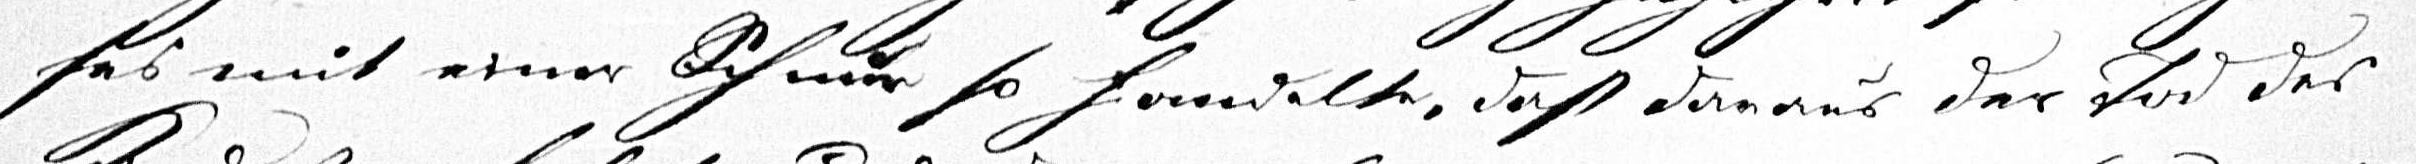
ses mit einer Schnur so handelte, daß daraus der Tod des
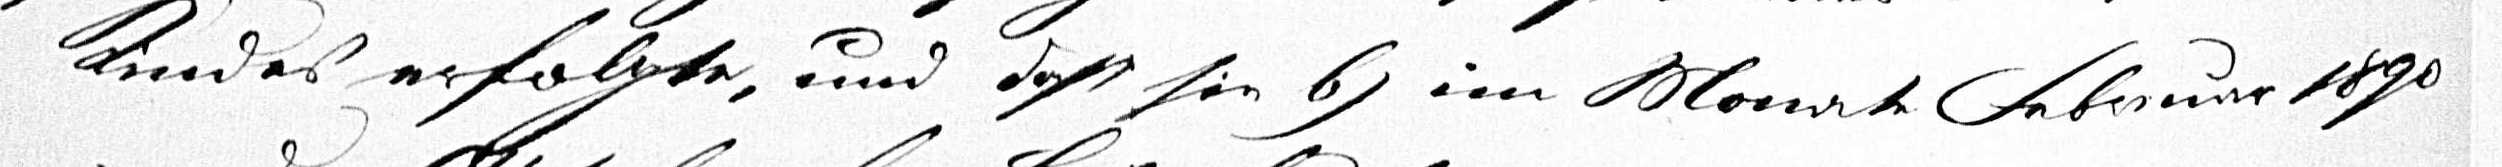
Kindes erfolgte, und daß sie b) im Monate Februar 1890
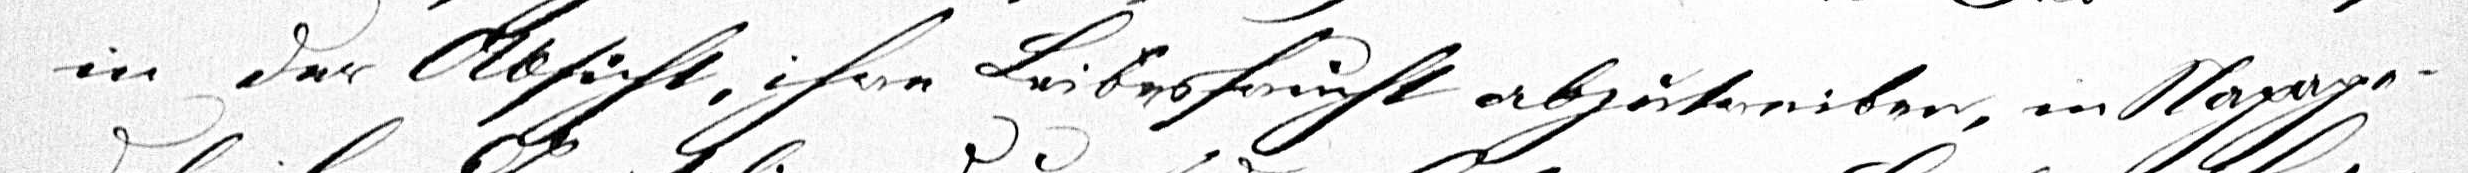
in der Absicht, ihre Leibesfrucht abzutreiben, in Napage¬
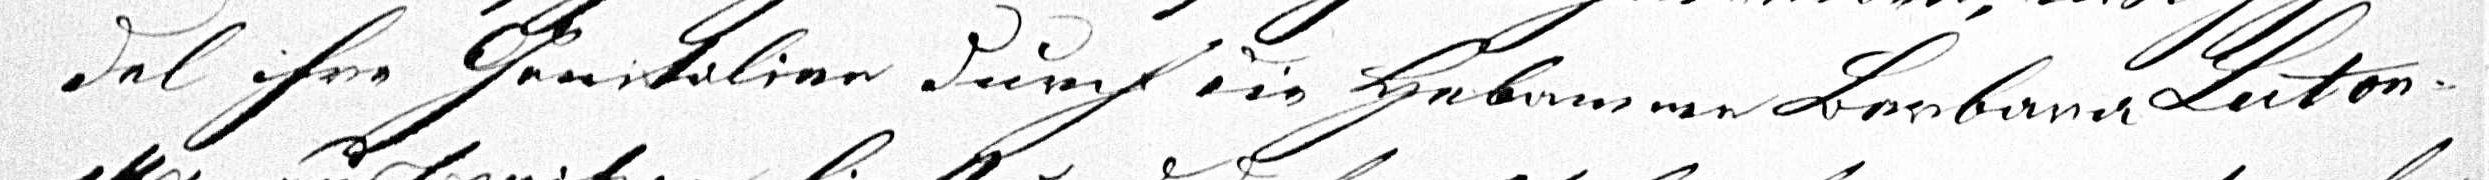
dal ihre Genitalien durch die Hebamme Barbara Luton¬
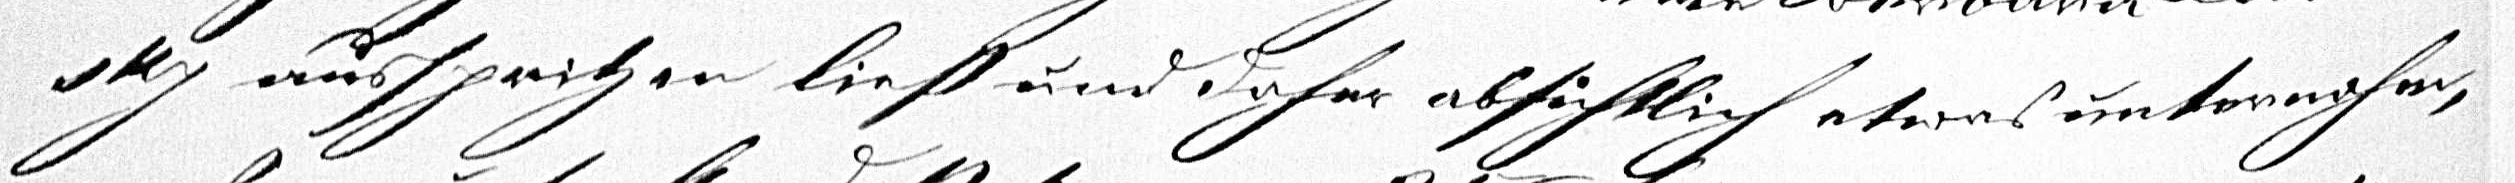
sky ausspritzen ließ und daher absichtlich etwas unternahm,
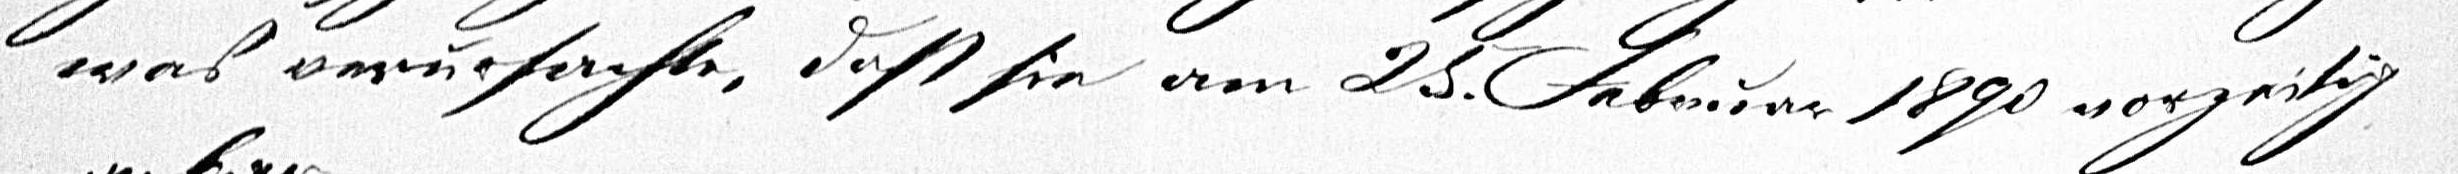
was verursachte, daß sie am 25. February 1890 vorzeitig
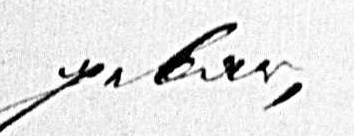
gebar,
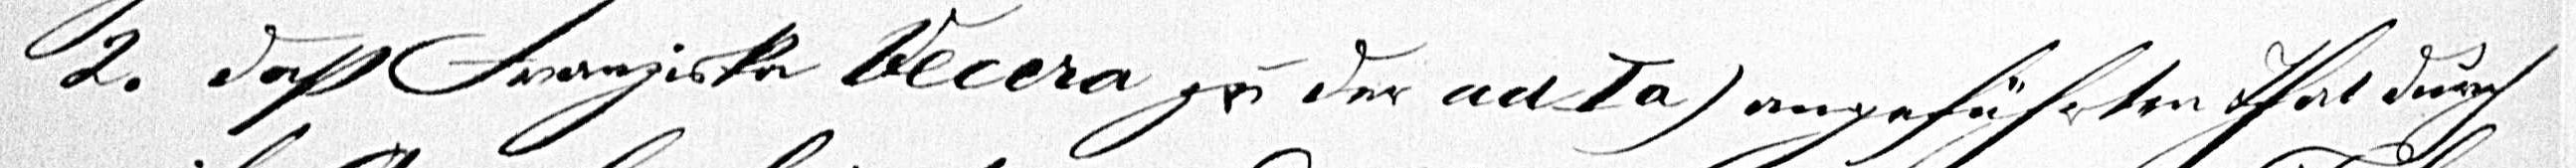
2. daß Franziska Večera zu der ad Ia angeführten That durch
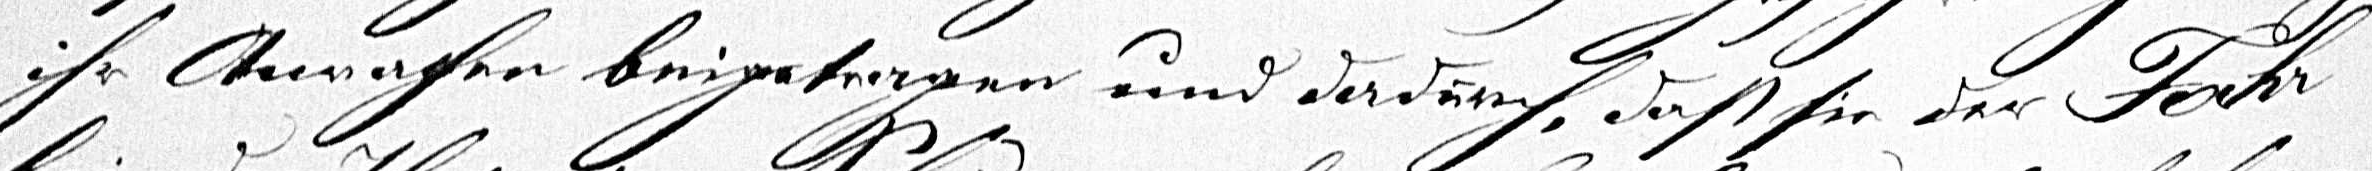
ihr Anrathen beigetragen und dadurch, daß sie der Foehr
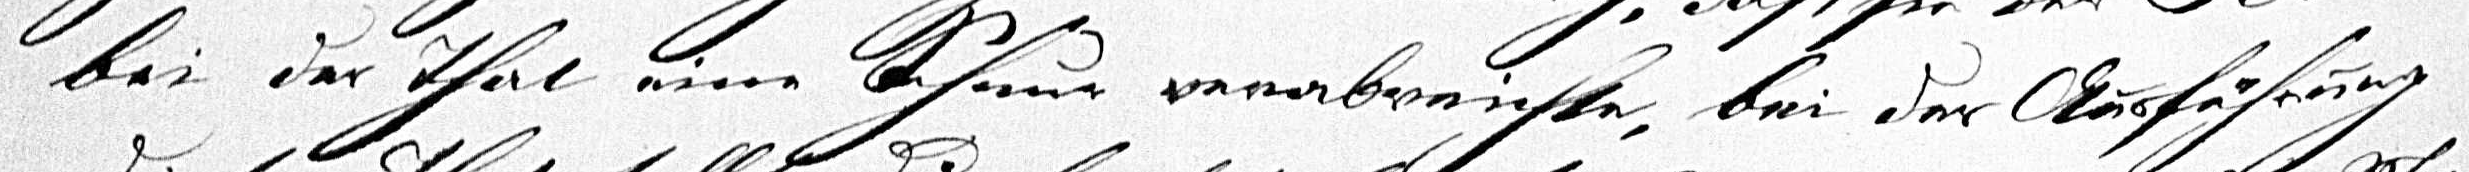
bei der That eine Schnur verabreichte, bei der Ausführung
